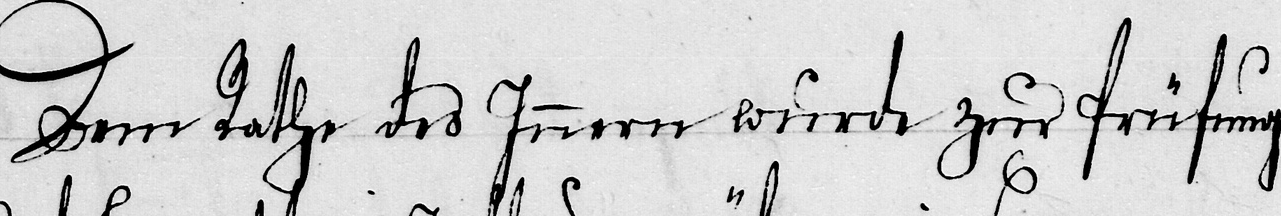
Dem Rathe des Innern wurde zur Prüfung
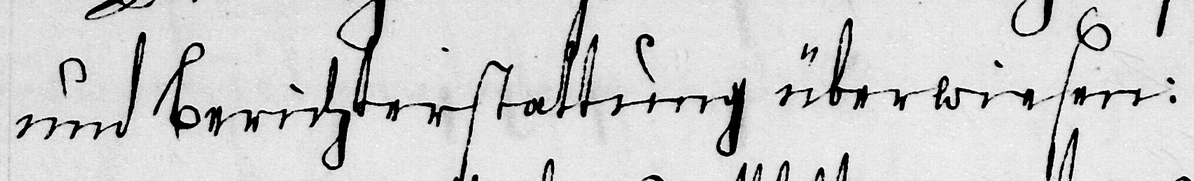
und Berichterstattung überwiesen:
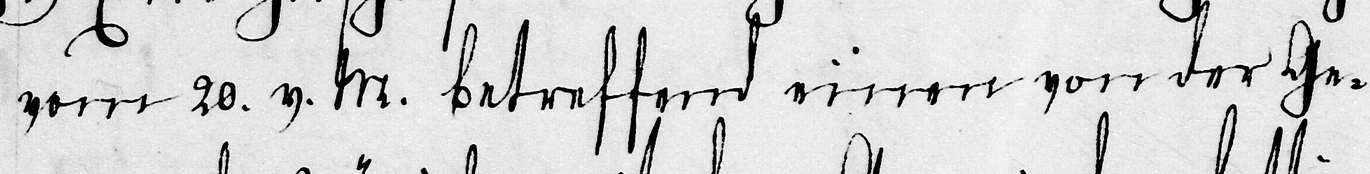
vom 20. v. M. betreffend einen von der Ge¬
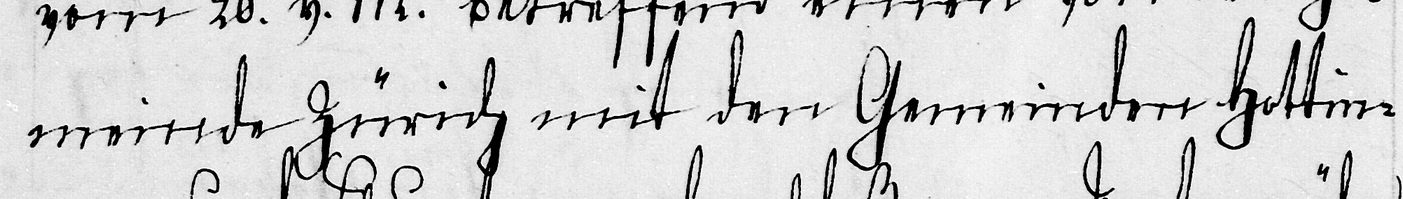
meinde Zürich mit den Gemeinden Hottin¬
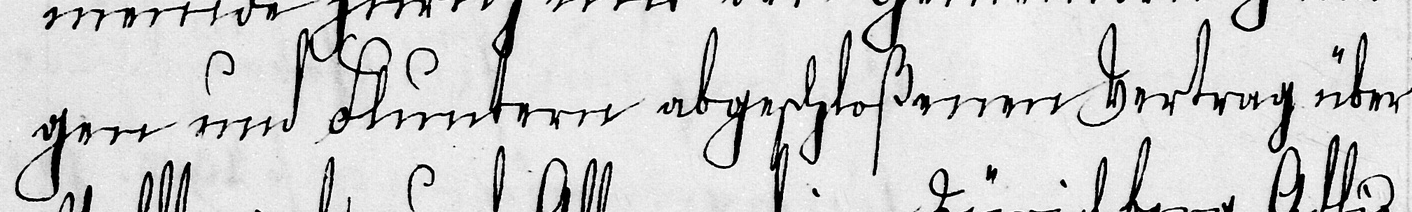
gen und Fluntern abgeschloßenen Vertrag über
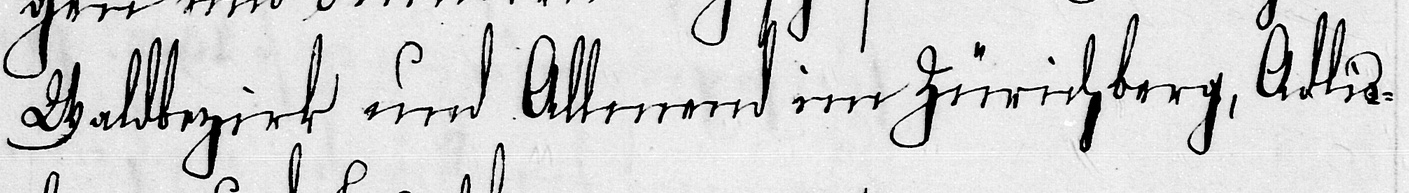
Waldbezirk und Allmend im Zürichberg, Adlis¬
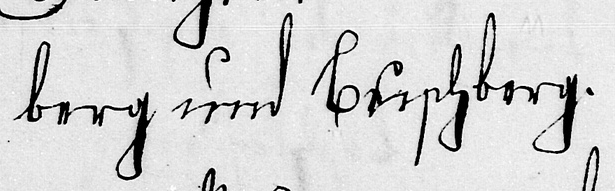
berg und Buschberg.
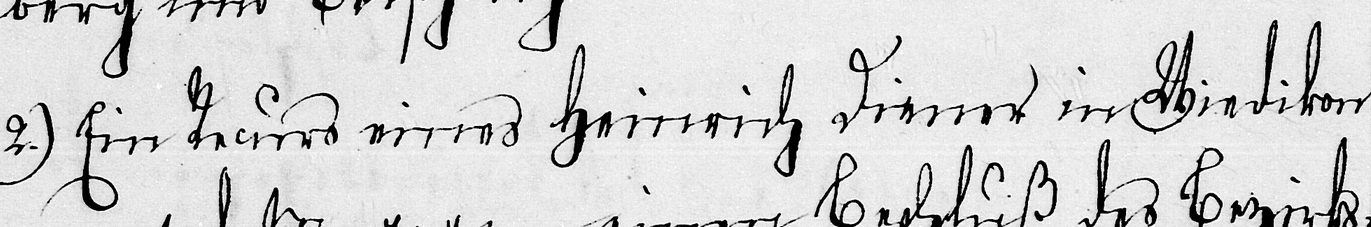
2.) Ein Recurs eines Heinrich Diener in Wiedikon
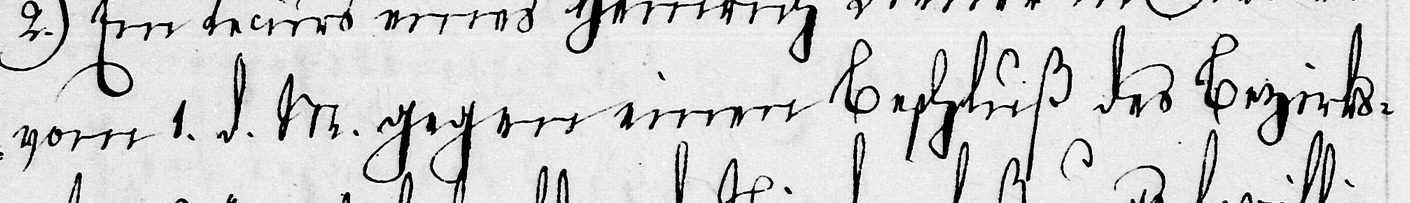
vom 1. d. M. gegen einen Beschluß des Bezirks¬
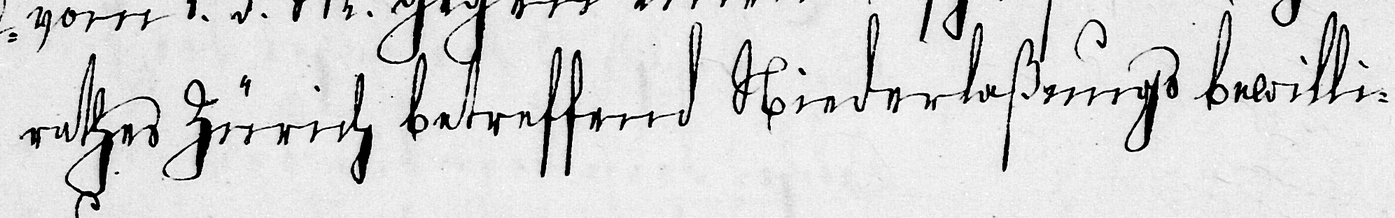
rathes Zürich betreffend Niederlaßungsbewilli¬
